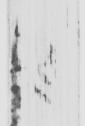必
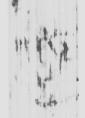慼
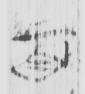百
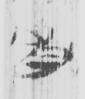眚
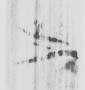之
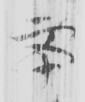不
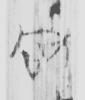和
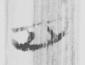四
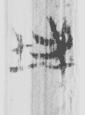{土丰}
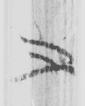之
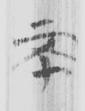不
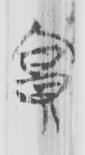實
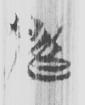佻
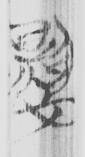{則戈}
